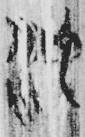池
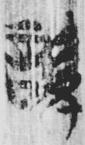○（厚）
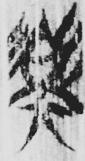樂
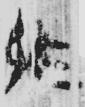於
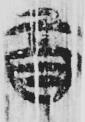酉（酒）
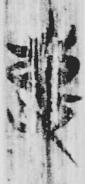尃（溥）
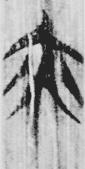亦（夜）
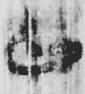㠯（以）
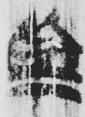爲
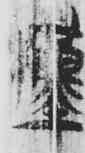槿（淫）
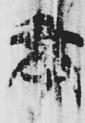不
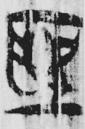聖（聽）
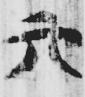亓（其）
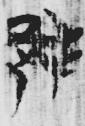邦
